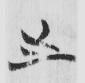之
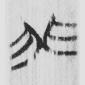非
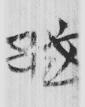{戉阝}
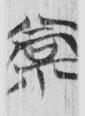常
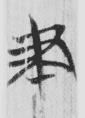申
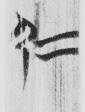𡰥
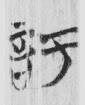訏
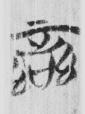{絲言}
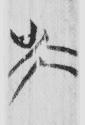吳
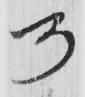乃
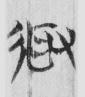{彳取}
